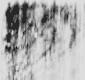所
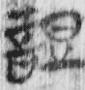○（屬）
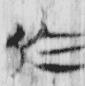於
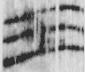王
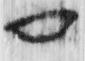○（私）
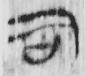司
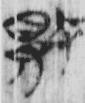敗
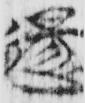逿
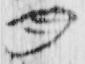月
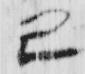己
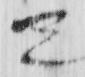巳
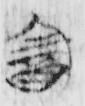酓（熊）
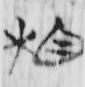相
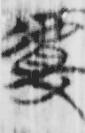○（且）
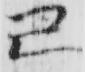己
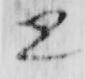巳
